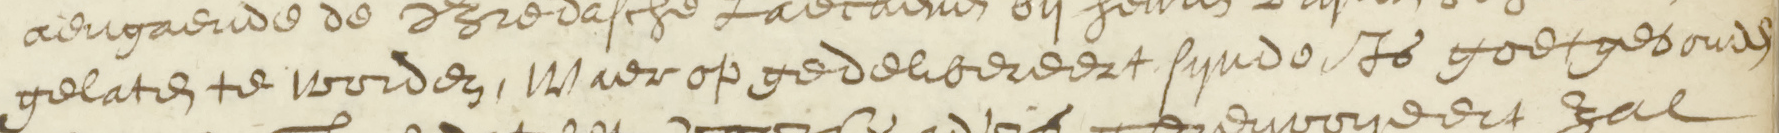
gelaten te worden, Waer op gedelibereert synde, Is goetgevonden
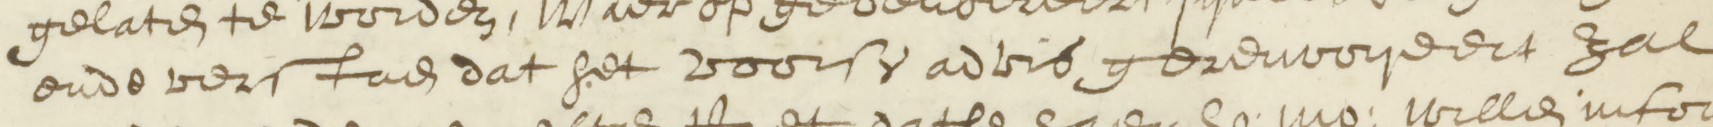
ende verstaen dat het voors advis gerenvoyeert zal
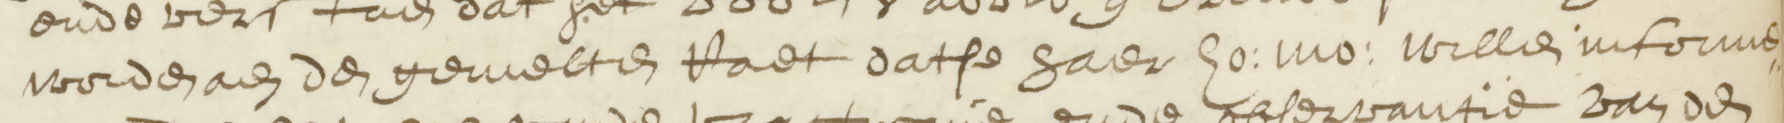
worden aen den gemelten Raet datse haer ho:mo: willen informe„
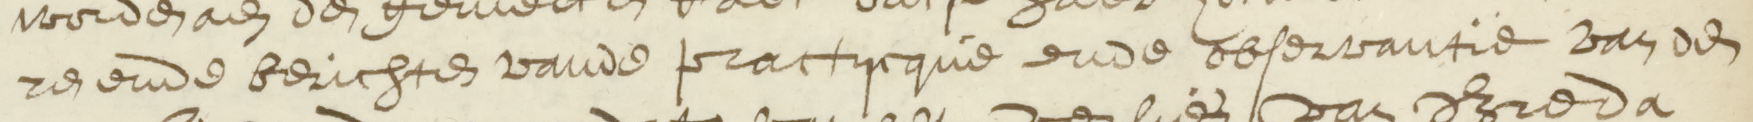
ren ende berichten vande practycque ende observantie van den
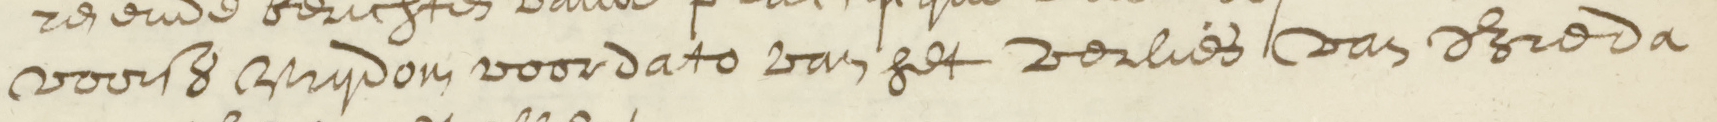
voors vrydom voor dato van het verlies van Breda
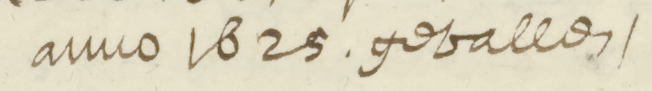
anno 1625. gevallen.
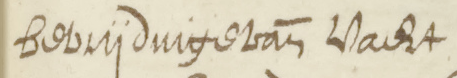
bevrijdinge van Vaert
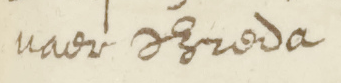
naer Breda
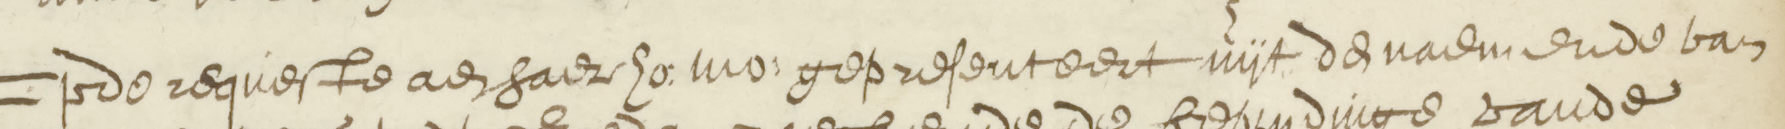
Opde requeste aen haer ho:mo: gepresenteert uijt den naem ende van
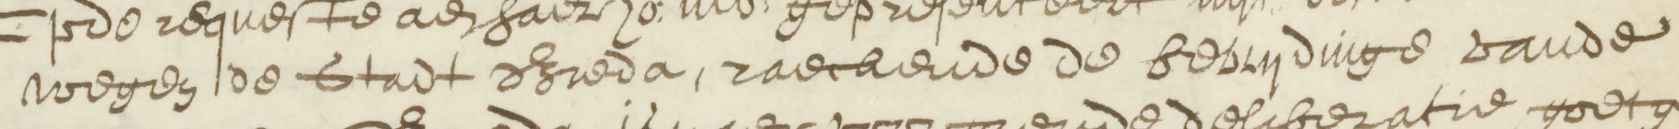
wegen de Stadt Breda, raeckende de bevrydinge vande
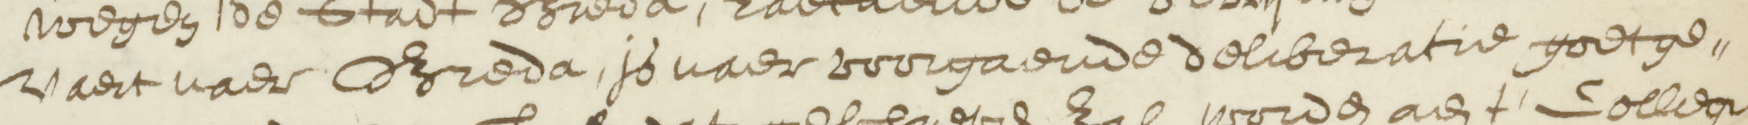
Vaert naer Breda, is naer voorgaende deliberatie goetge„
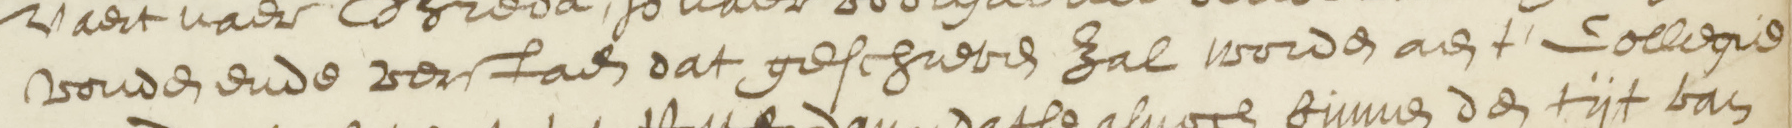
vonden ende verstaen dat geschreven zal worden aen t‛Collegie
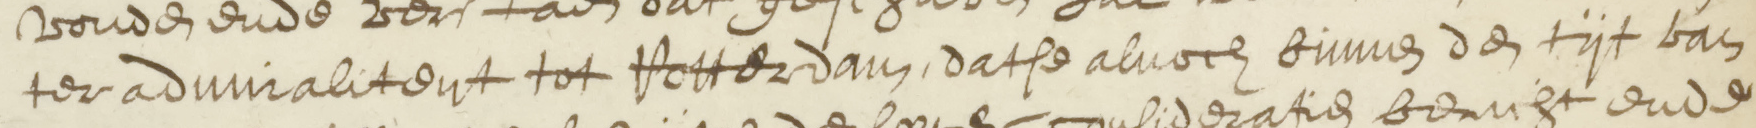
ter admiraliteyt tot Rotterdam, datse alnoch binnen den tijt van
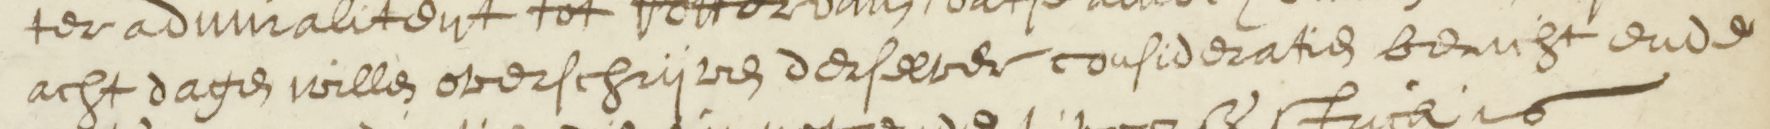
acht dagen willen overschrijven derselver consideratien bericht ende
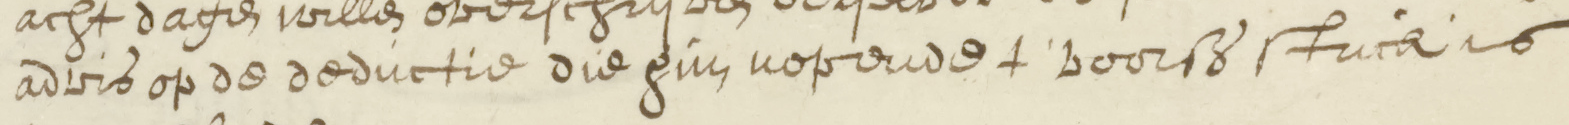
advis op de deductie die hun nopende t‛voors stuck is
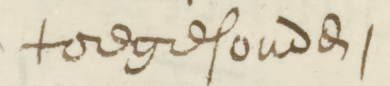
toegesonden.
